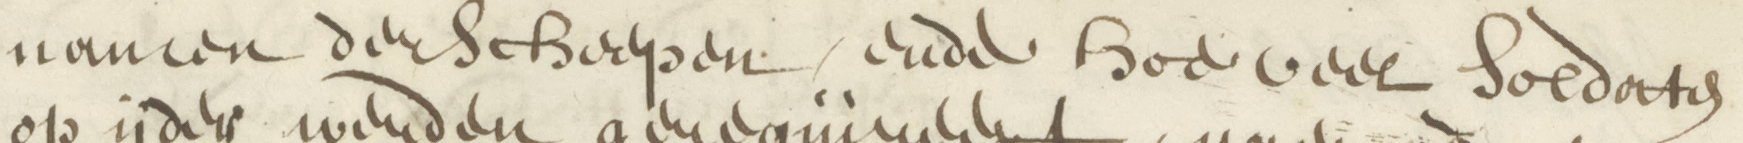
namen der Scheepen, ende hoe veel Soldaten
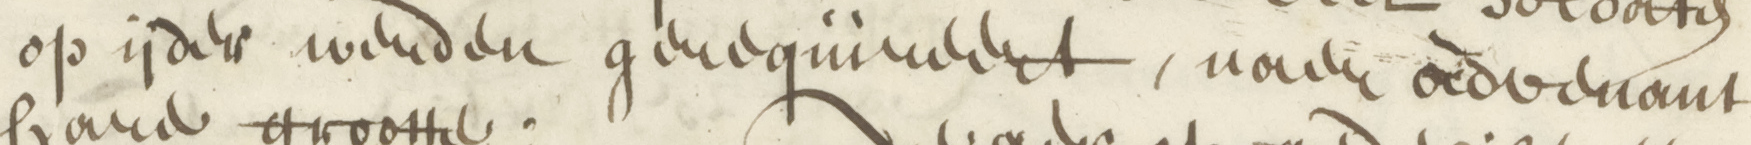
op ijder werden gerequireert, naer advenant
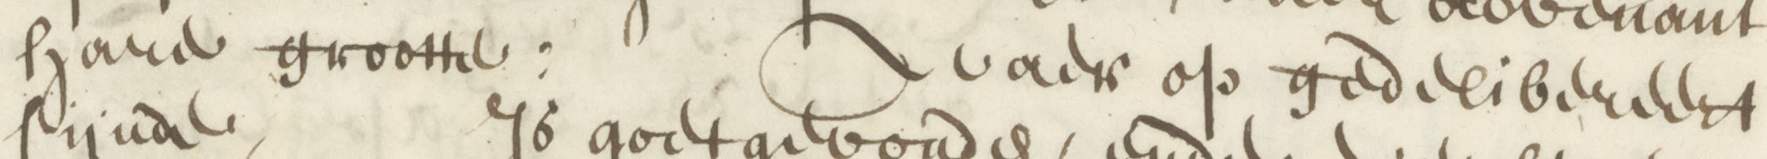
hare grootte: Waer op gedelibereert
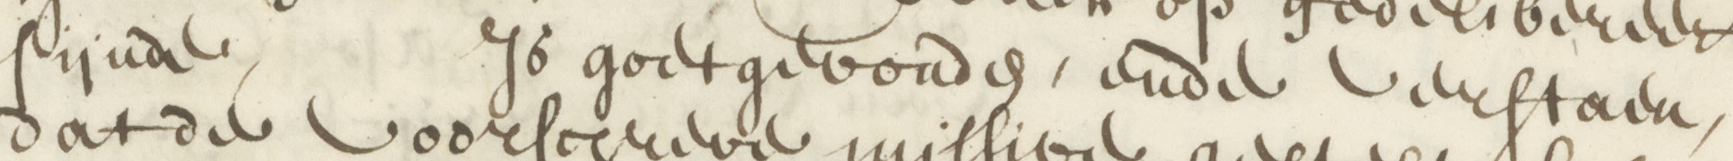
sijnde, Is goetgevonden, ende verstaen,
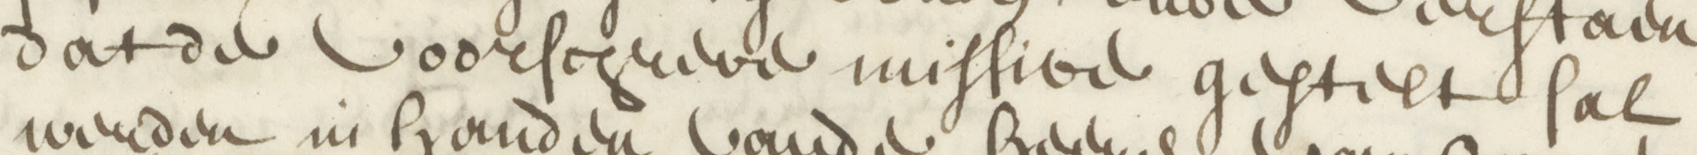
dat de voorschreve missive gestelt sal
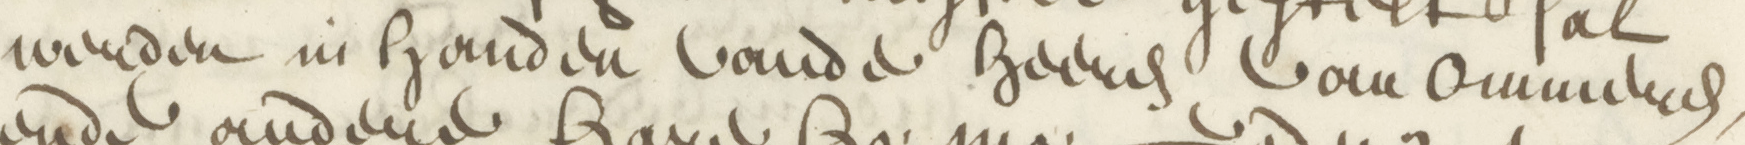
werden in handen vande heeren van Ommeren,
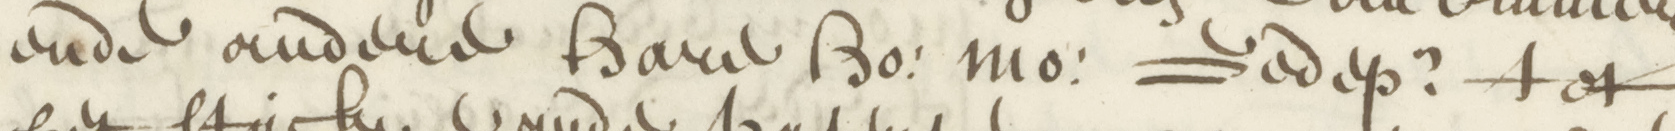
ende andere hare Ho:Mo: Gedepen. tot
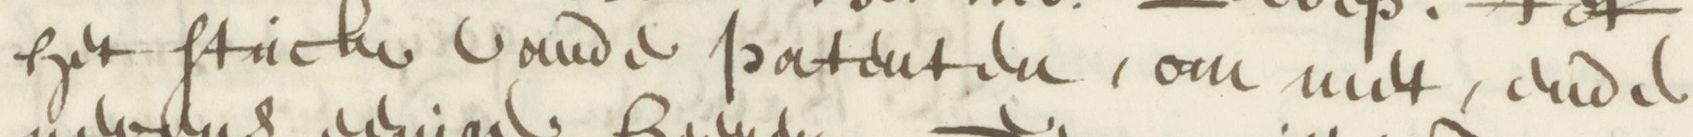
het stuck vande patenten, om met, ende
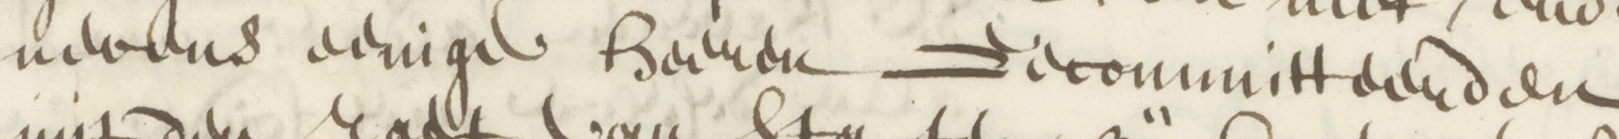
nevens eenige heeren Gecommitteerden
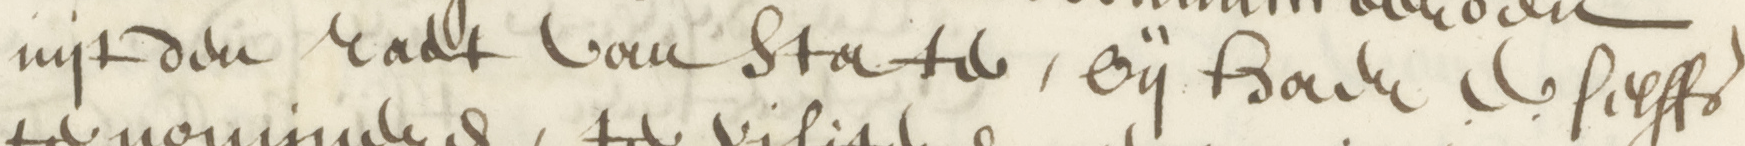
uijt den Raet van State, bij haer E. selffs
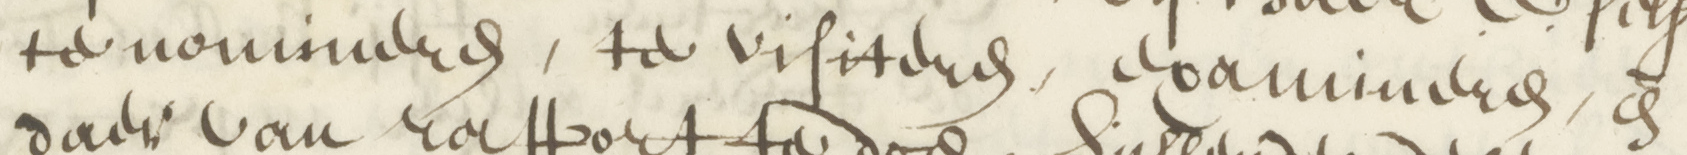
te nomineren, te visiteren, examineren, en
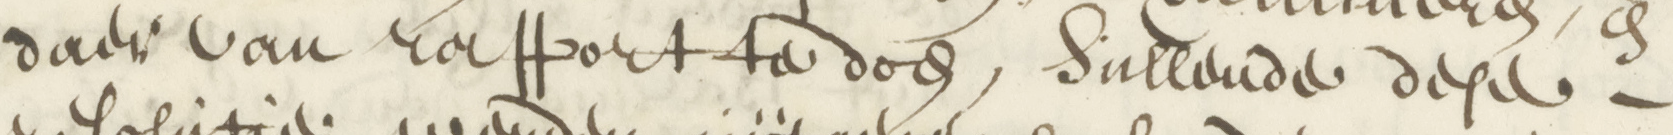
daer van rapport te doen, Sullende dese -
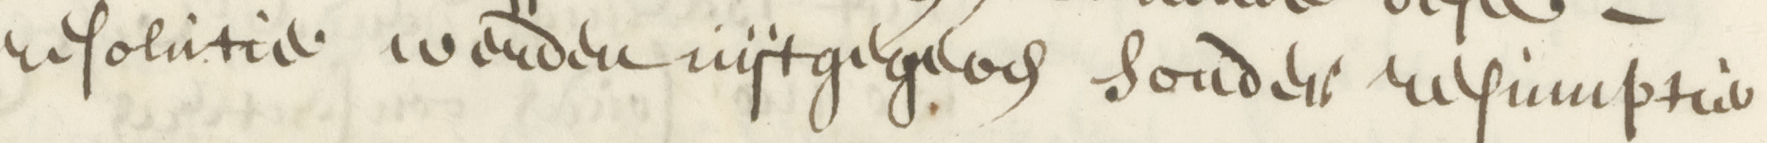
resolutie werden uijtgegeven sonder resumptie.
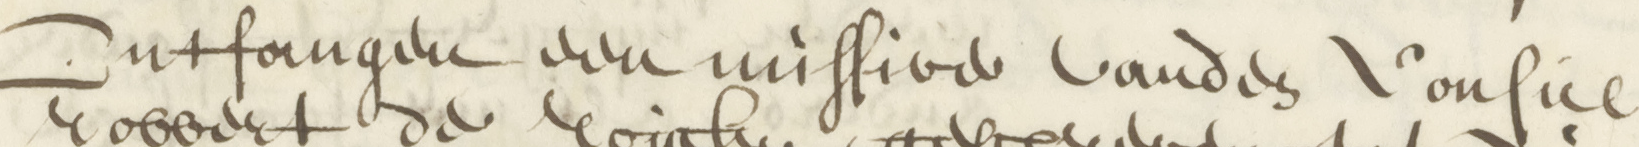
Ontfangen een missive vanden Consul
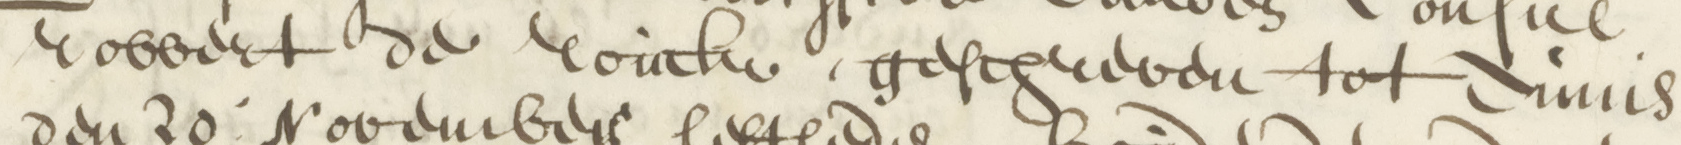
Robbert de Rouck, geschreven tot Tunis
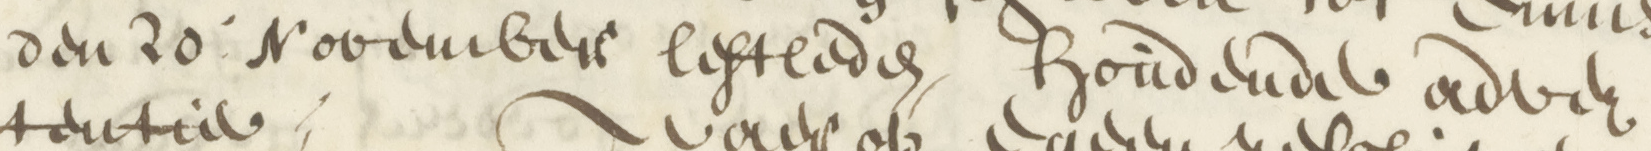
den 20’. November lestleden, houdende adver
